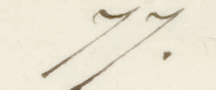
77
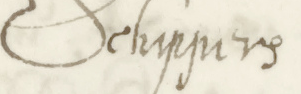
Schippers
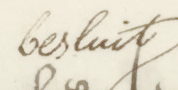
besluit
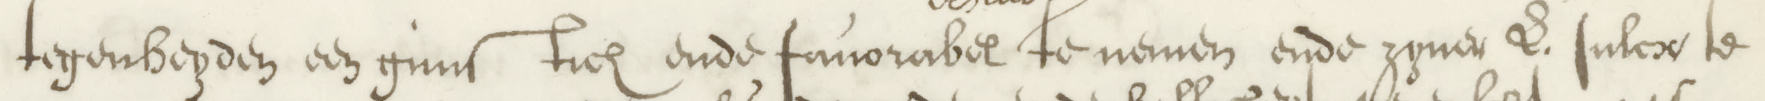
tegenheyden een gunstich ende fauorabel te nemen ende zyner E. sulcx te
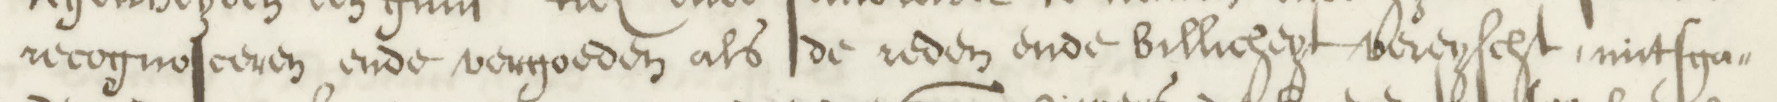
recognesceren ende vergoeden als de reden ende billicheyt vereyscht, mitsga„
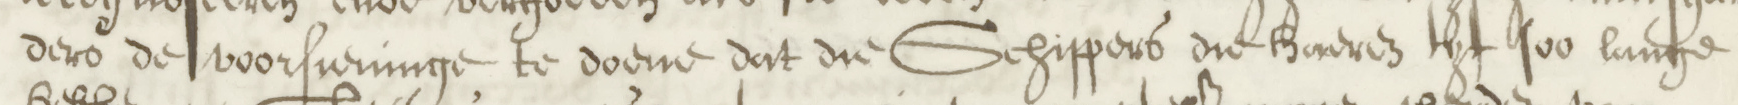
ders de voorsieninge te doene dat die Schippers die haeren tyt soo lange
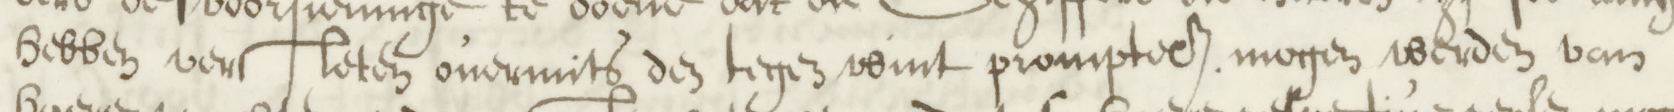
hebben versleten ouermits den tegen wint promptel mogen werden van
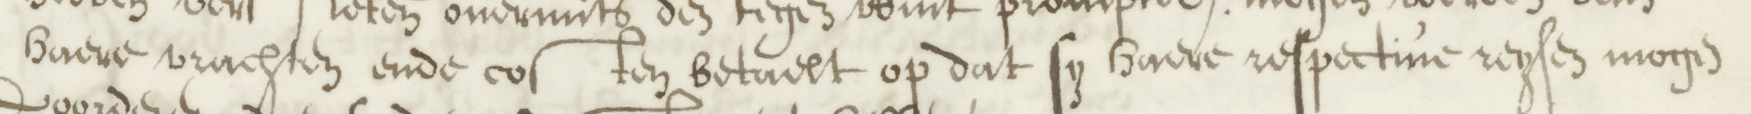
haer vrachten ende costen betaelt op dat sy haere respectiue reysen mogen
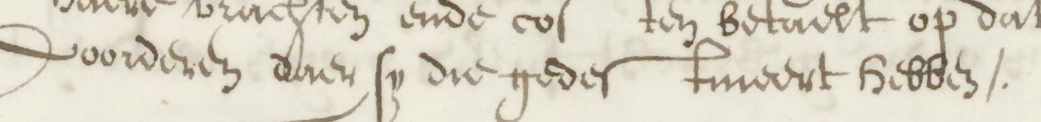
voorderen daer sy die gedestineert hebben.
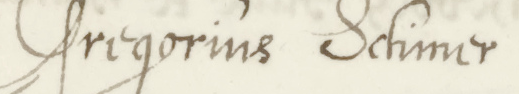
Gregorius Schiuer
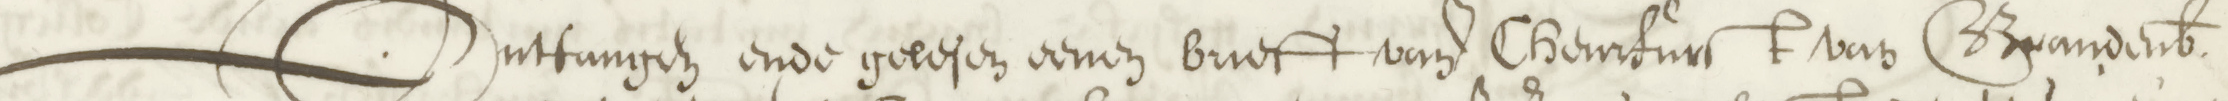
Ontfangen ende gelesen eenen brieff van Cheurfurst van Brandenb.
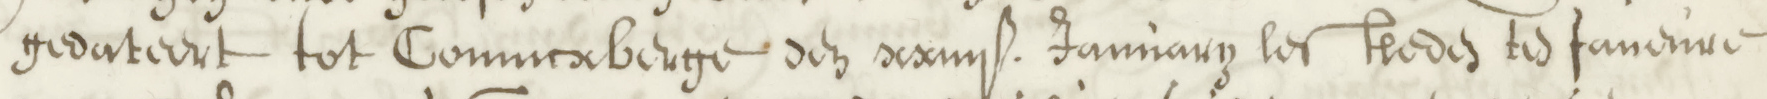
gedateert tot Conincxberge den xxiiije January lestleden ten faueure
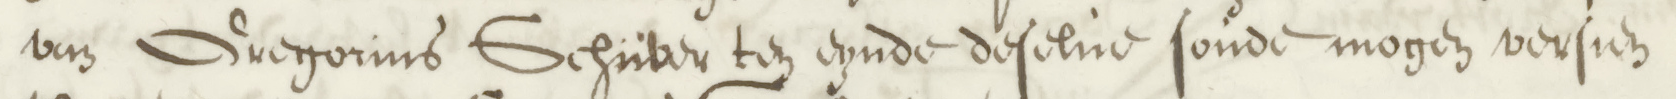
van Gregorius Schiver ten eynde deselue soude mogen versien
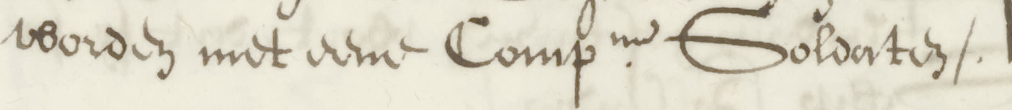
worden met een Compnie Soldaten.
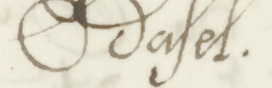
Basel
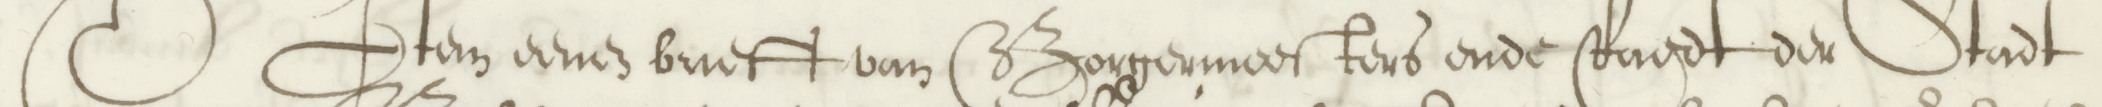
Item eenen brieff van Borgermeesters ende Raedt der Stadt
